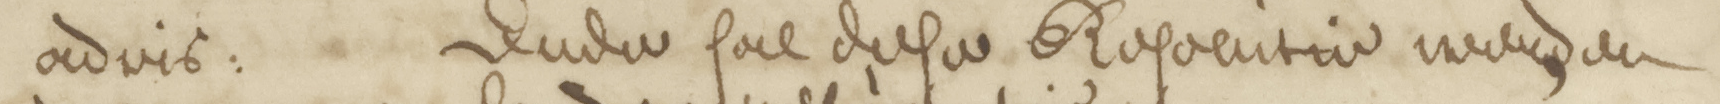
advis: Ende sal dese Resolutie werden
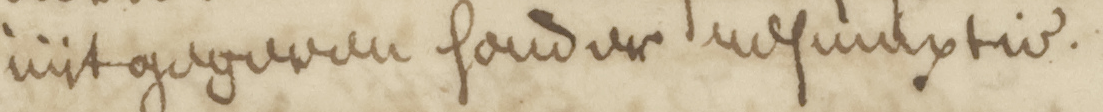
uijtgegeven sonder resumptie.
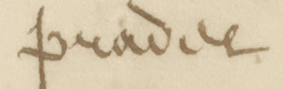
pradel
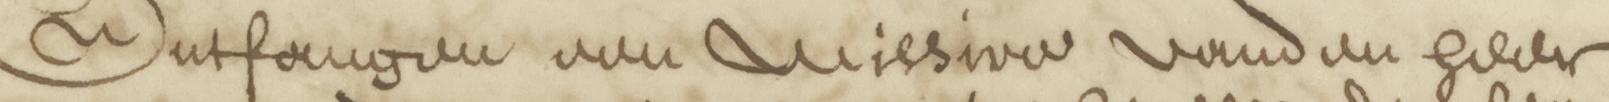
Ontfangen een Missive vanden heer
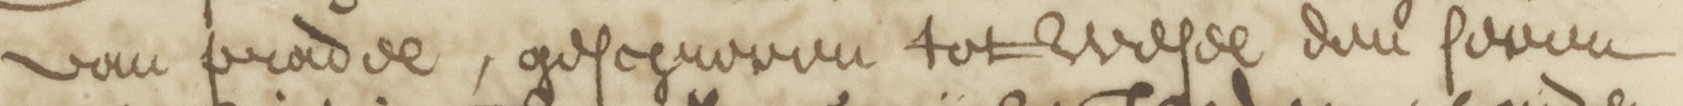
van pradel, geschreven tot Wesel den seven
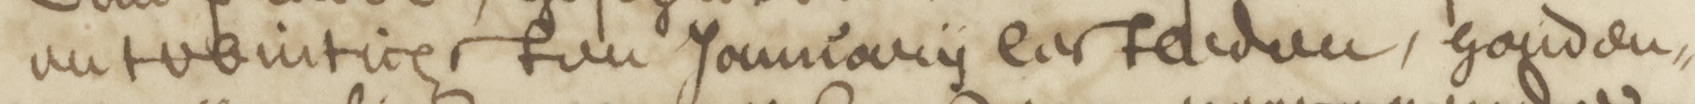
en twintichsten Januarij lestleden, houden„
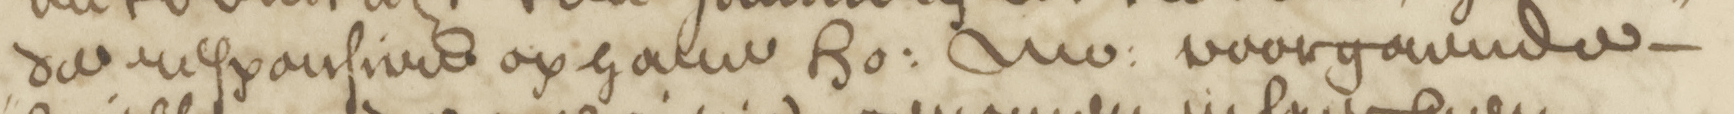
„de responsive, op hare Ho:Mo: voorgaende -
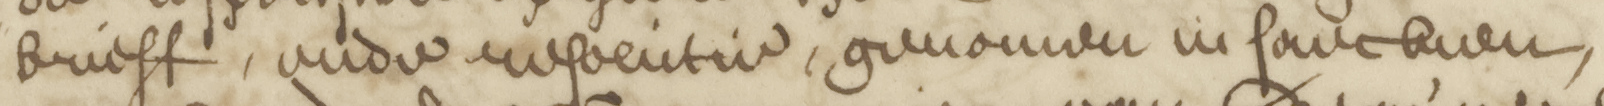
brieff, ende resolutie, genomen in saecken,
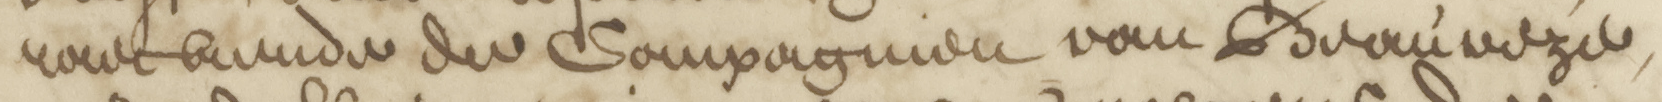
raeckende de Compagnien van Beauveze,
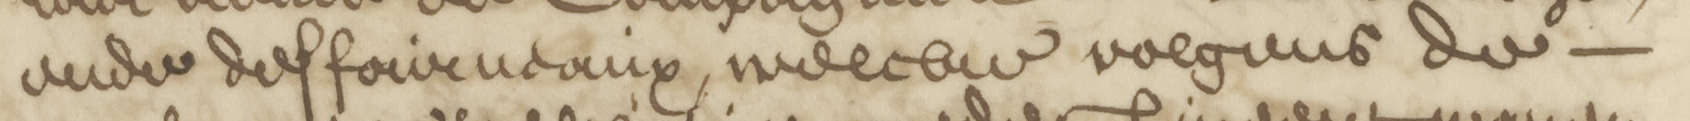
ende desfairneaux, welcke volgens de —
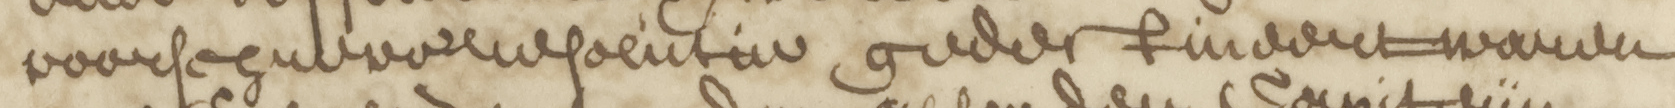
voorschreve resolutie gedestineert waren
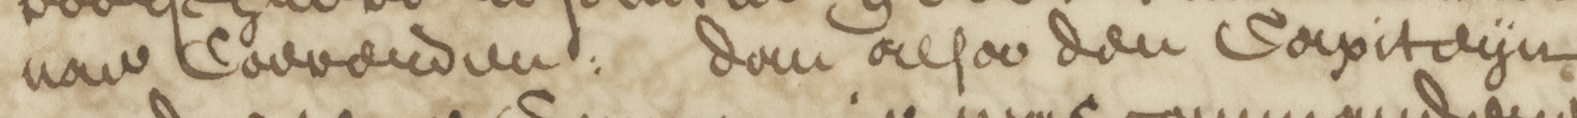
nae Coeverden: dan alsoe den Capiteijn
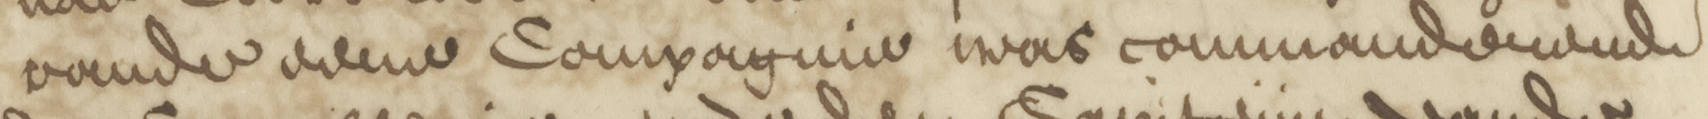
vande eene Compagnie was commanderende
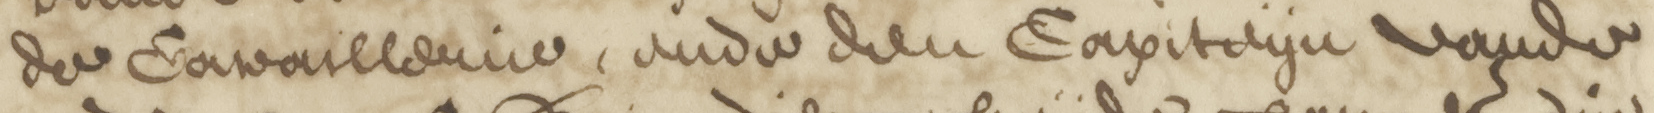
de Cavaillerie, ende den Capiteijn vande
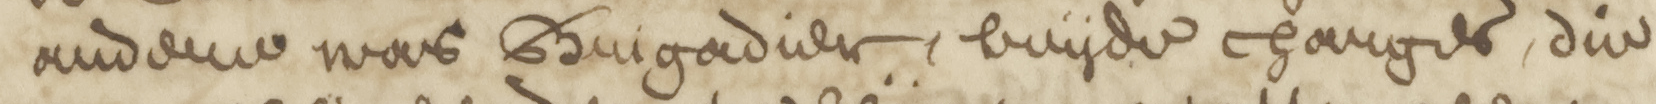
andere was Brigadier, beijde charges, die
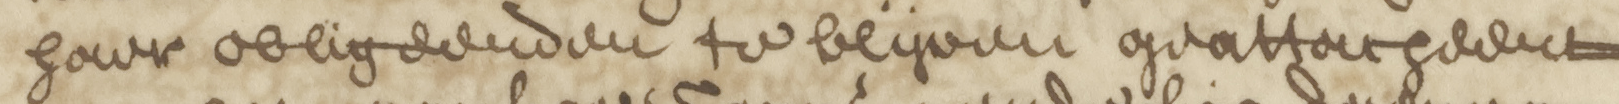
haer obligeerden te blijven geattacheert
